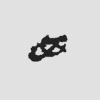皿
